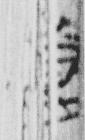情
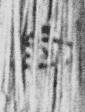出
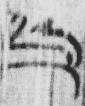于
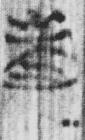眚（性）
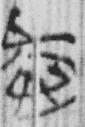○（愛）
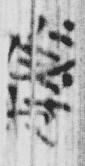頪（類）
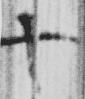七
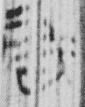唯
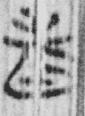眚（性）
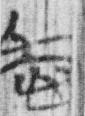○（愛）
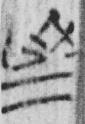爲
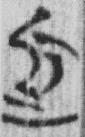近
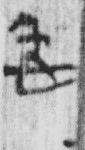○（仁）
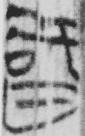智
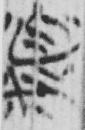頪（類）
